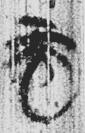而
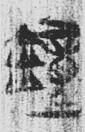鐘
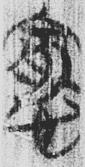愈
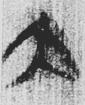大
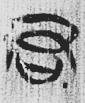君
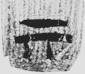亓
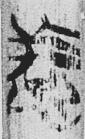○（圖）
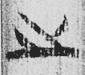之
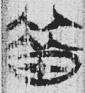昔
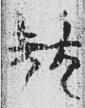堯
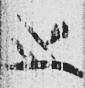之
